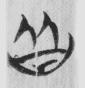皆
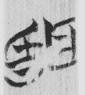䎽
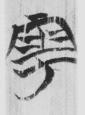𩁹
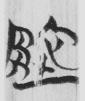地
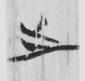之
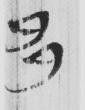多
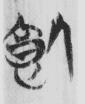飤
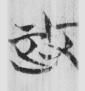政
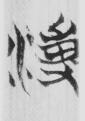溥
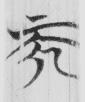而
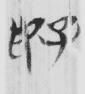好
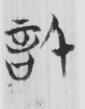信
